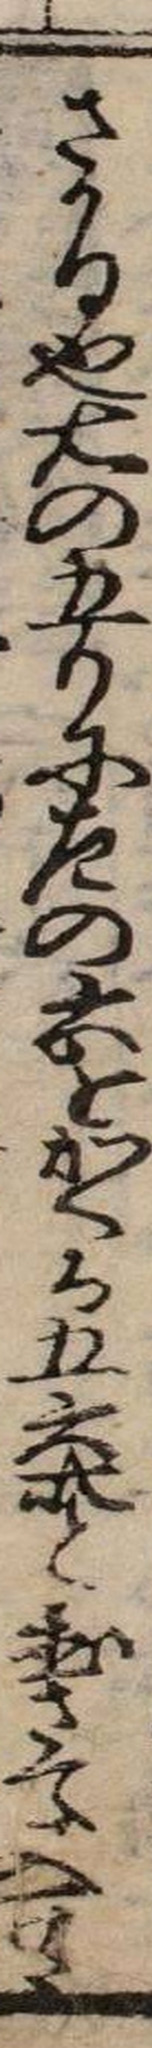さかる也右の五りに左の六をかくる五六卅と置きて又一けた
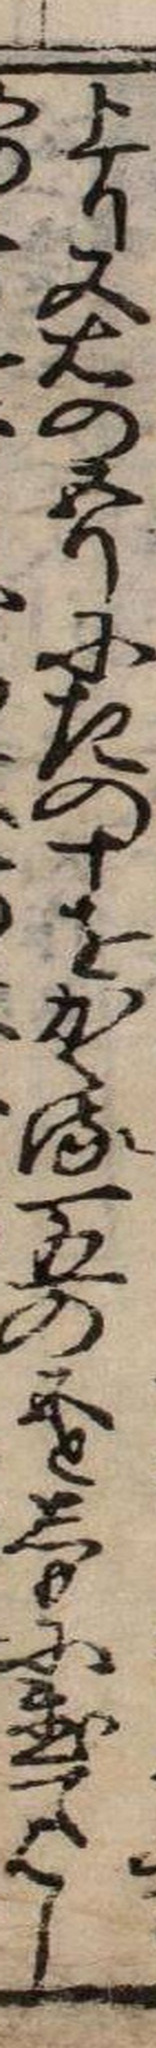上り又右の五りに左の十をかくる一五の五をしもに置てはし
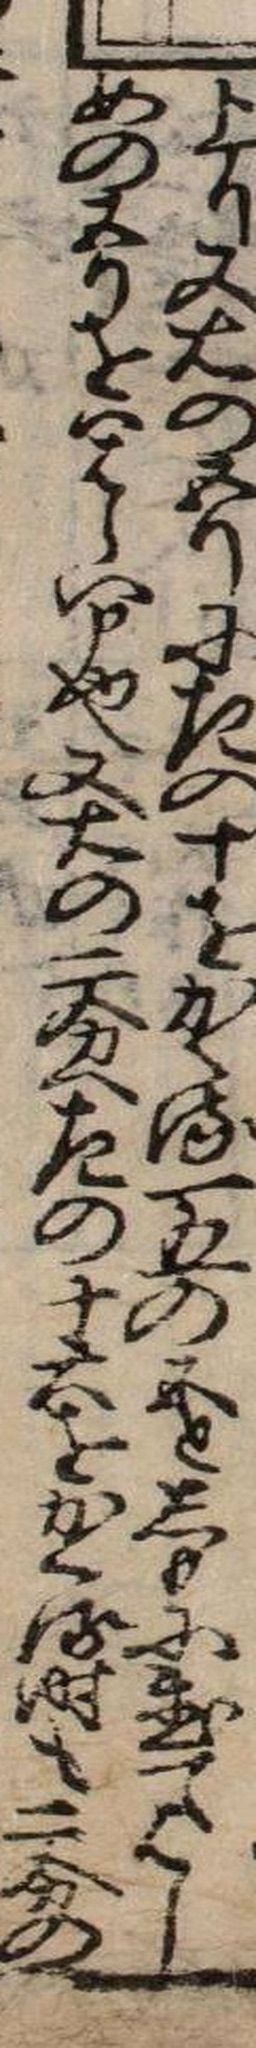めの五りをははらい申候也又右の二分へ左の十六をかくる時と二分の
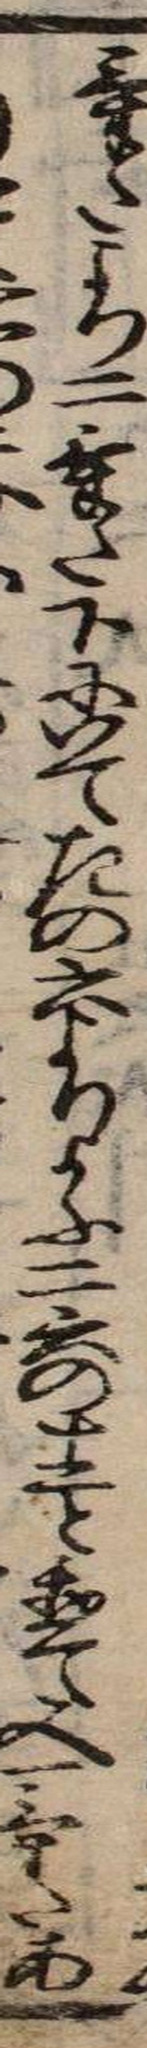けたより二けた下にいて左の六よりよふ二六の十二と置て又一けたあ
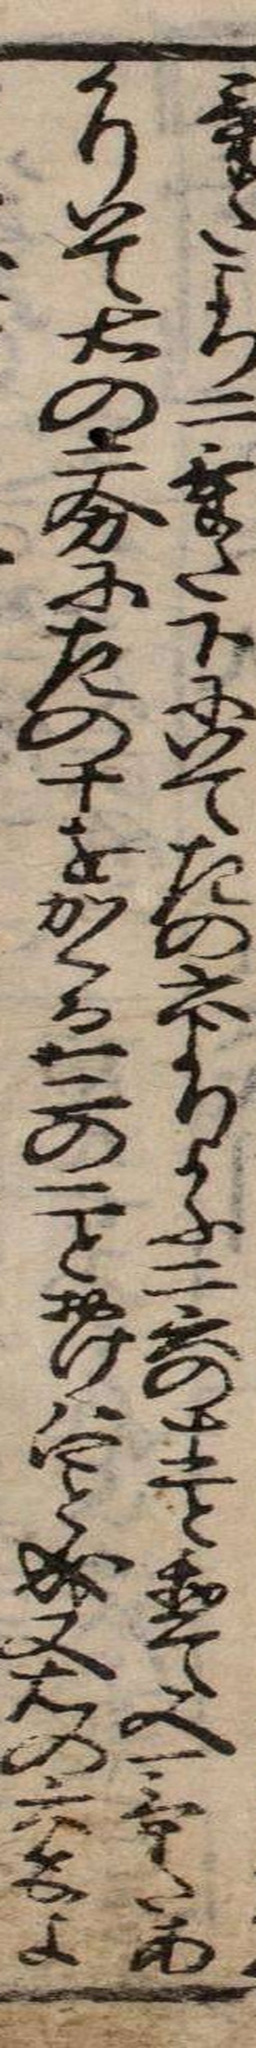かりいて右の二分に左の十をかくる一二の二とおけは四と成又右の六匁
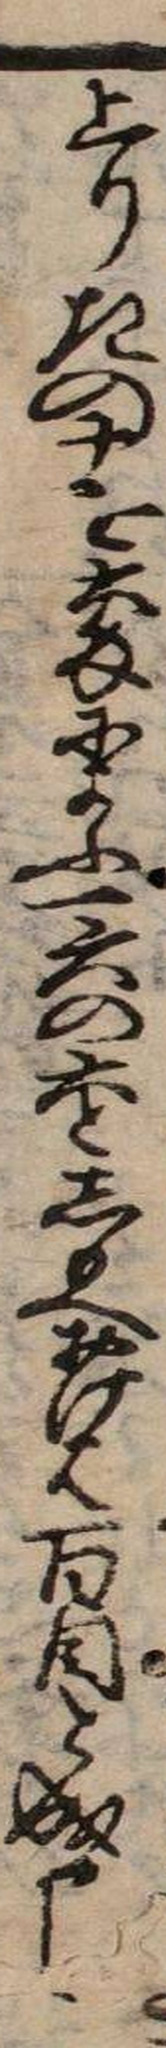上り左の十を六匁によふ一六の六としもへおけは百目と成也

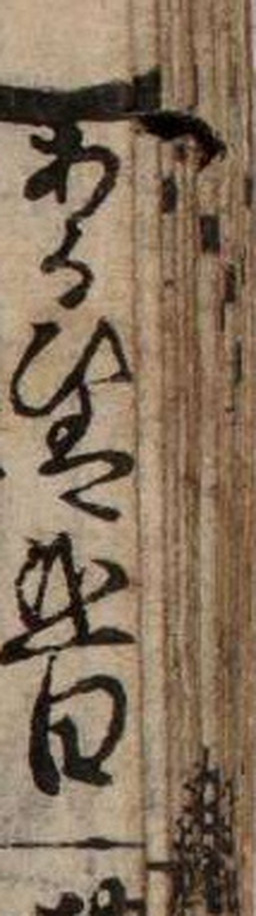あるひは弍百
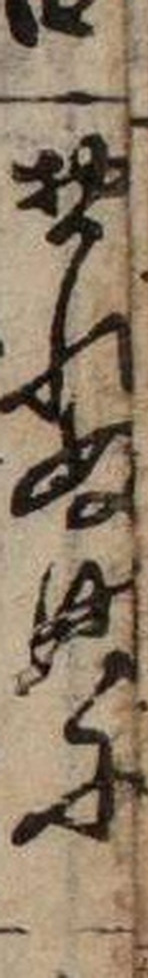おかれぬ時に
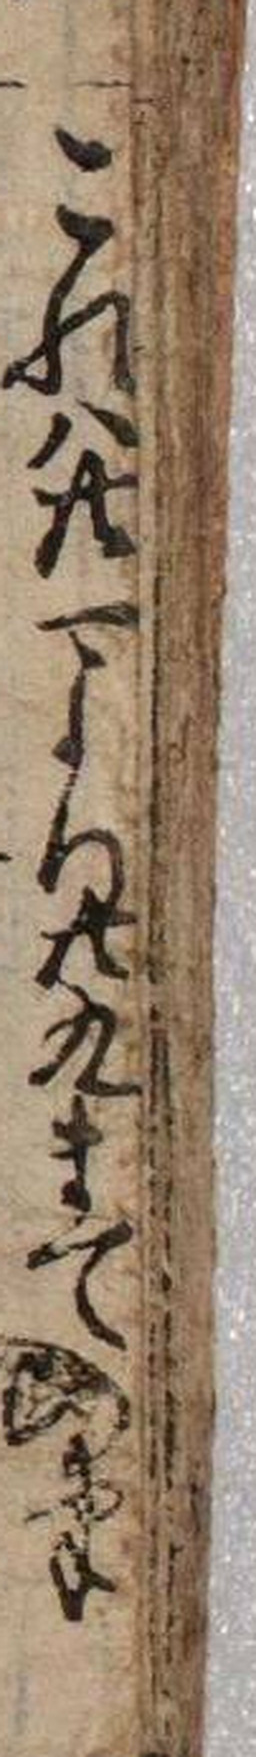これは廾一より廾九まての半
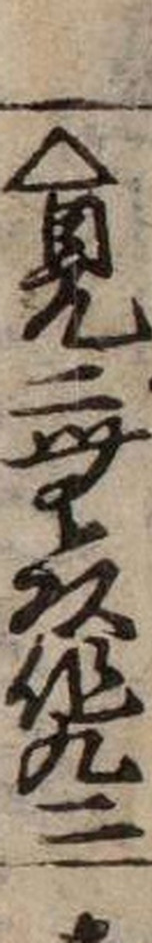△見二無頭作九二
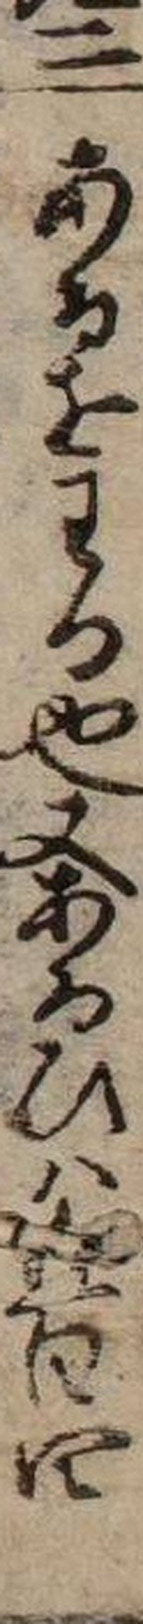あるをわる也又あるひは弍百四
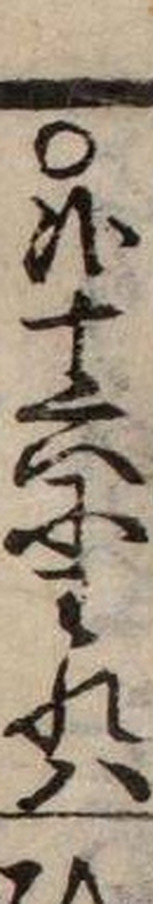○弍十六にわれは
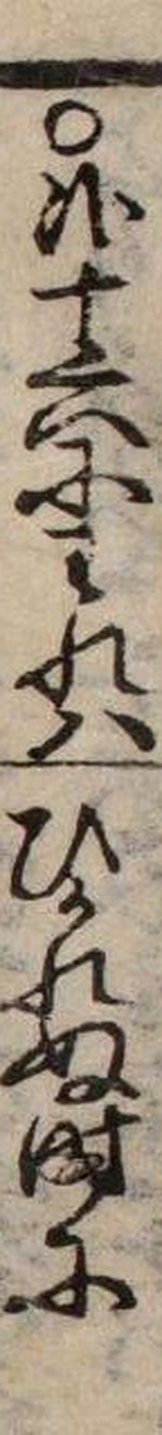○弍十六にわれは
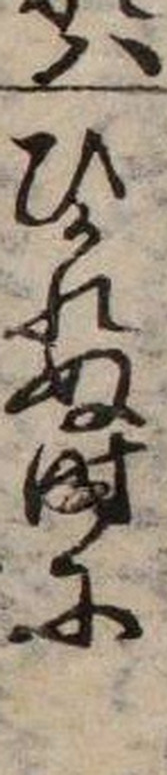ひかれぬ時に
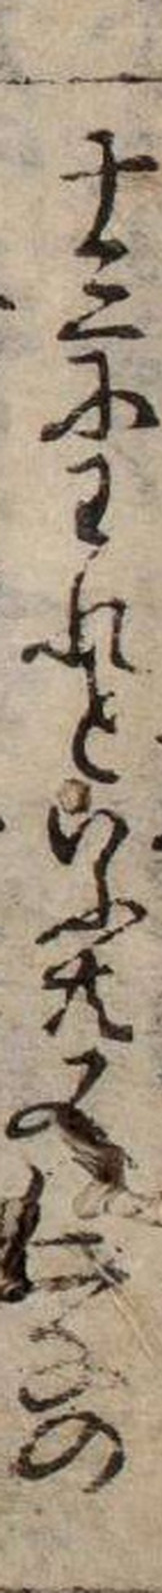十三にわれといふ共又二千の
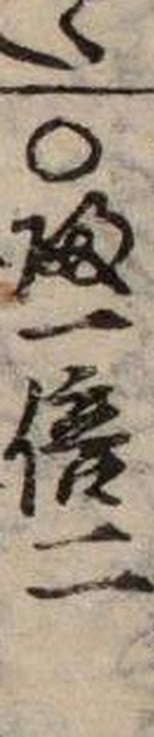○帰一倍二
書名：塵劫記（寛永11年自跋、京都府立京都学・歴彩館追貴8）
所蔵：京都府立京都学・歴彩館 国文学研究資料館
